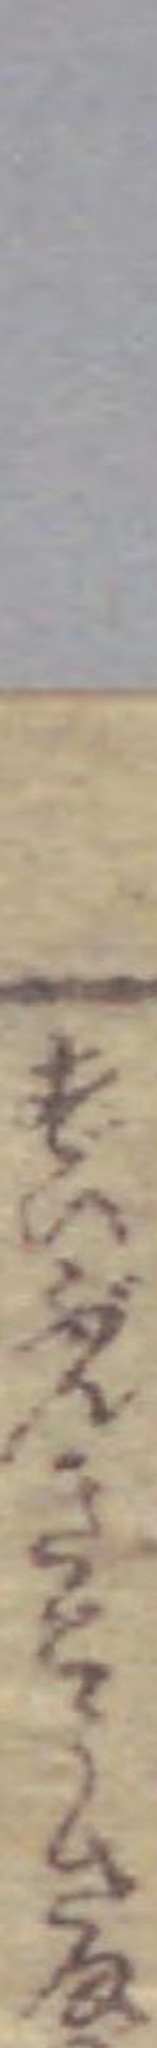ずいぶんきこうさまの
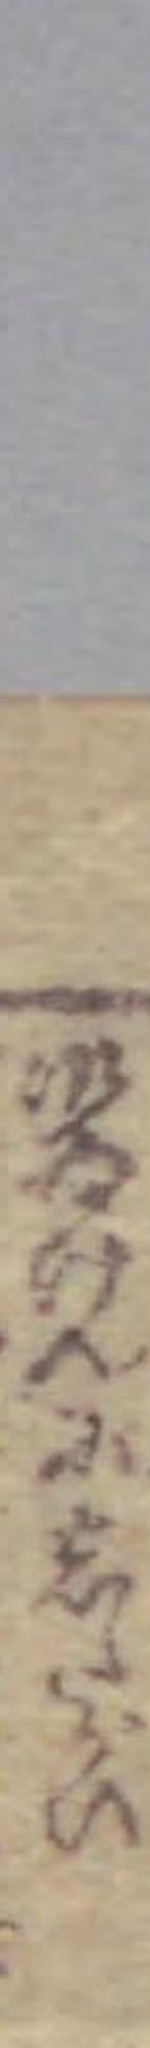御ゐけんにしたがい
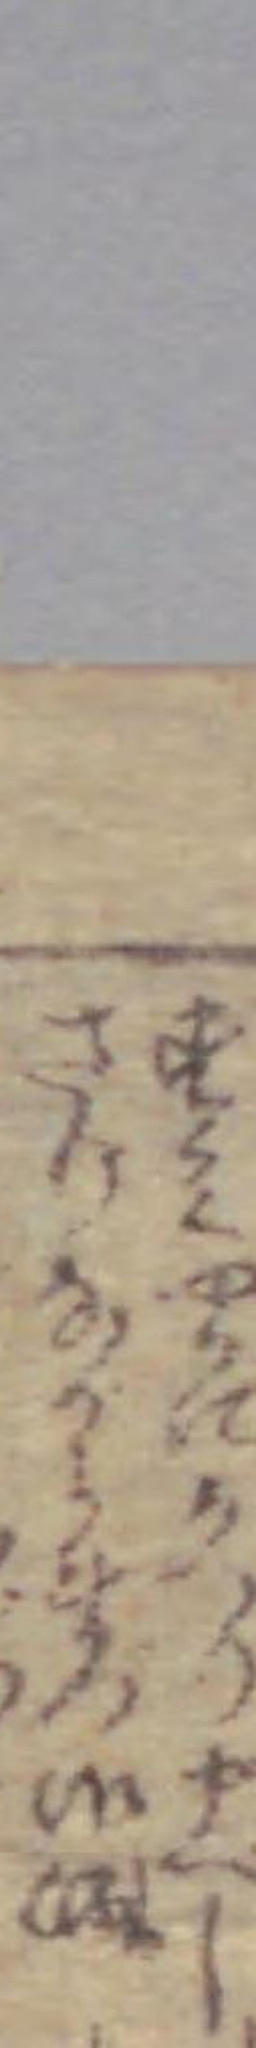さりながらまづ御酒
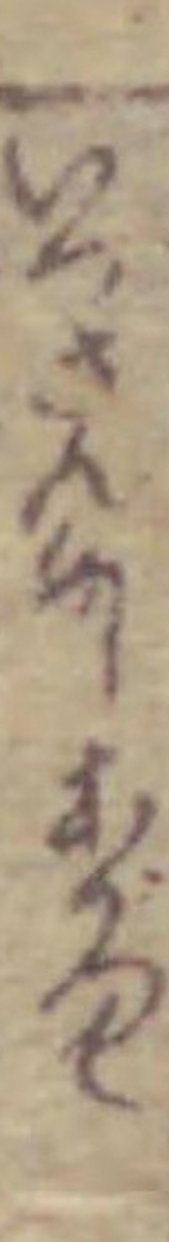いつさんめしあがつて
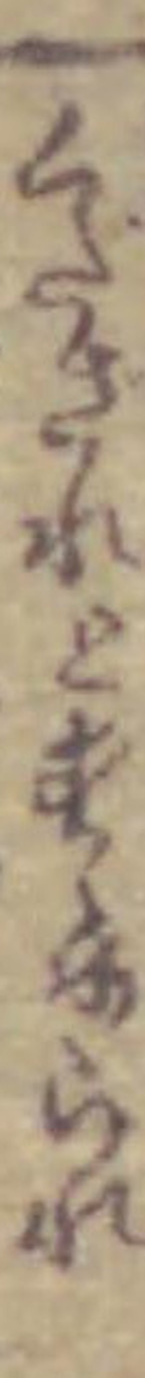くだされとすゝめられ
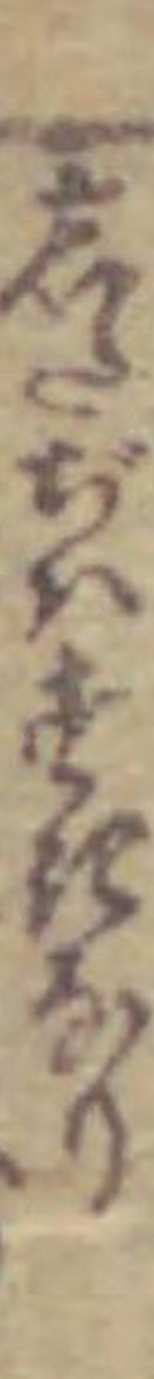したぢはすきなり
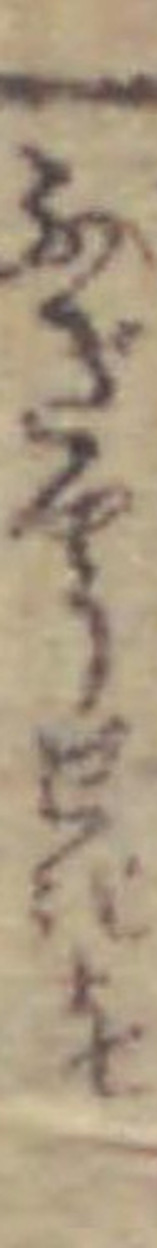ふぎやうせきを
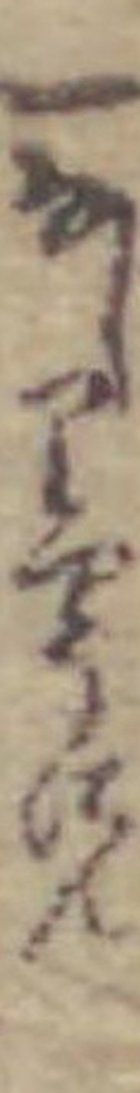なしりやうにん
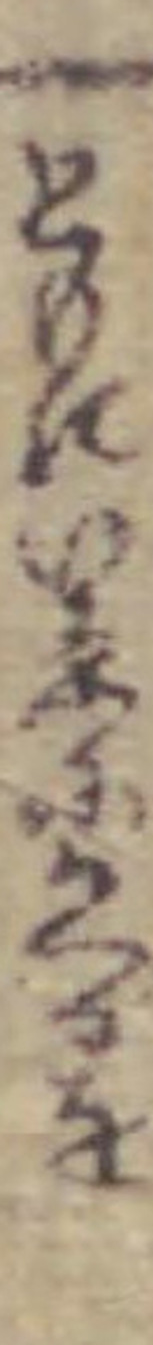ともにいゑにかへるを
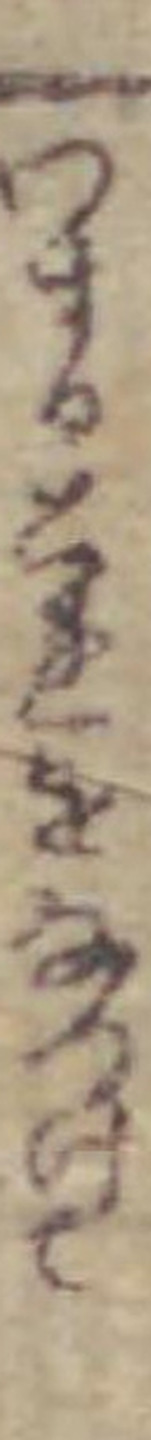わするこれをなつけて
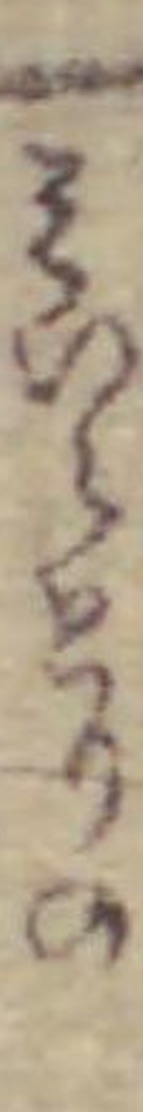みいらとりの
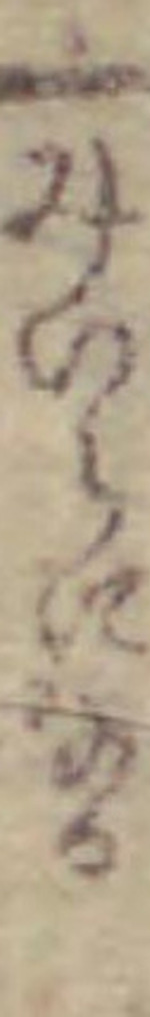みいらになる
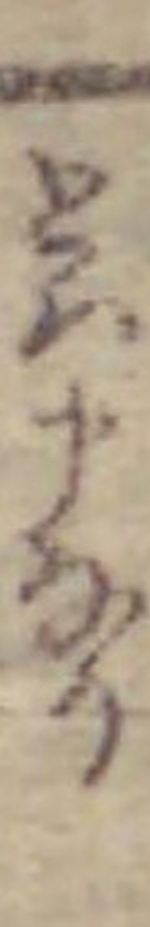とは申なり
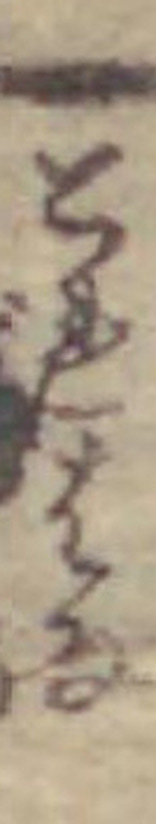これはな
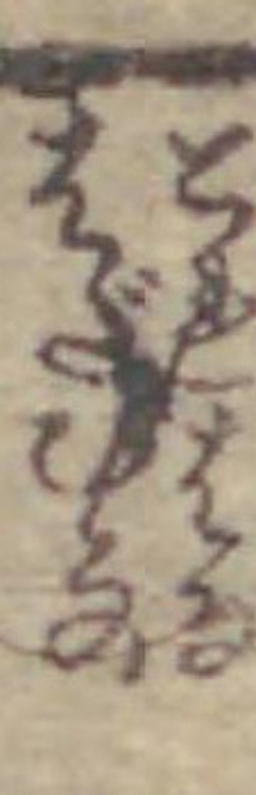はだひとの
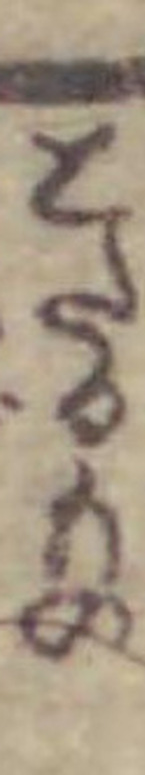こたるもの
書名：化物和本草 : 3巻
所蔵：国立国会図書館 National Diet Library, JAPAN
